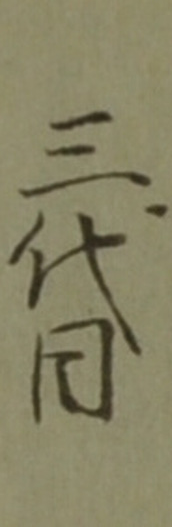三代目
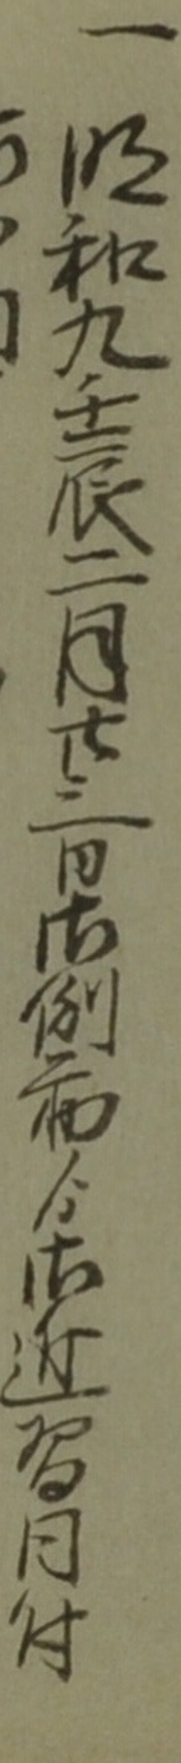一明和九壬辰二月廿三日御側勤ゟ御近習目付
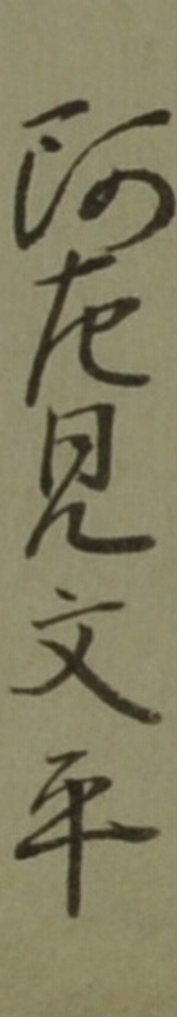阿左見文平
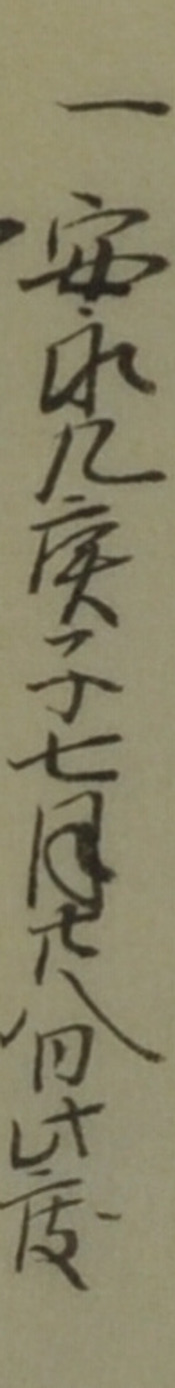一安永九庚子七月廿八日此度
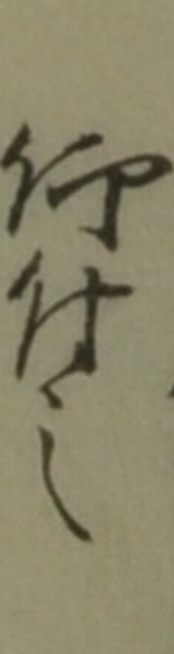仰付之
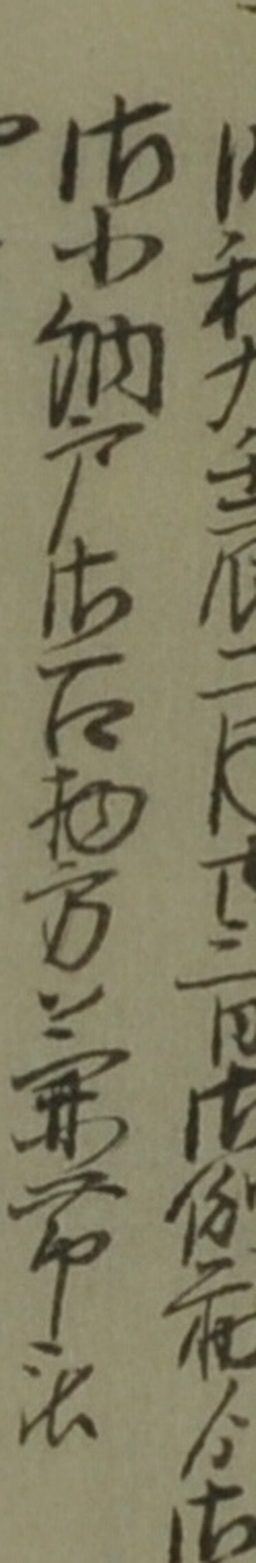御小納戸御召物方兼帯被
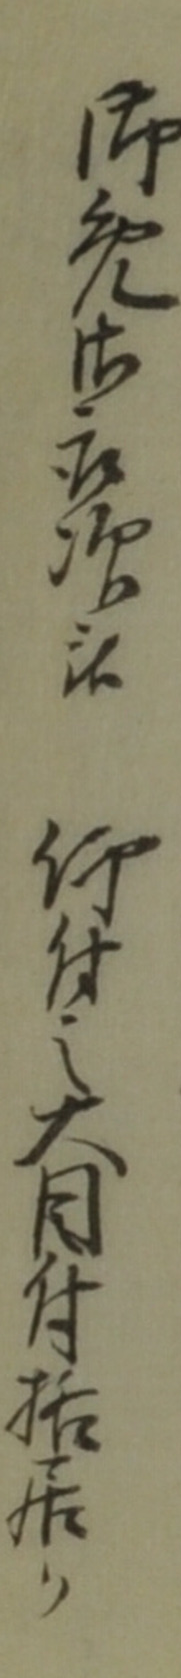御免御取次被仰付之大目付格居リ
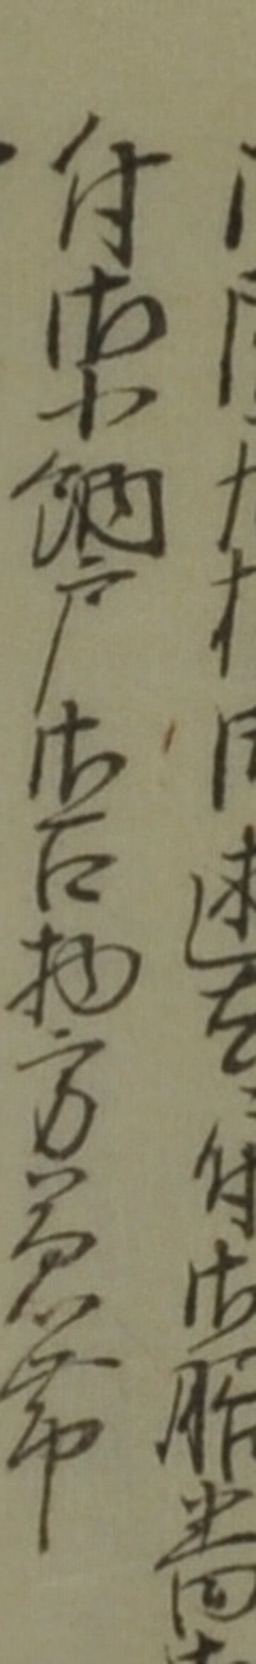付御小納戸御召物方兼帯
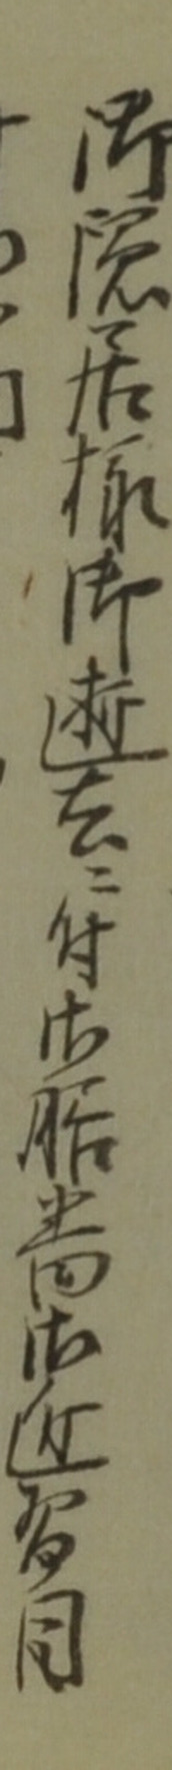御隠居様御逝去ニ付御膳番御近習目
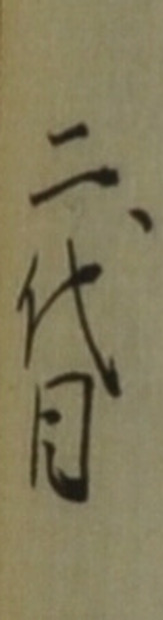二代目
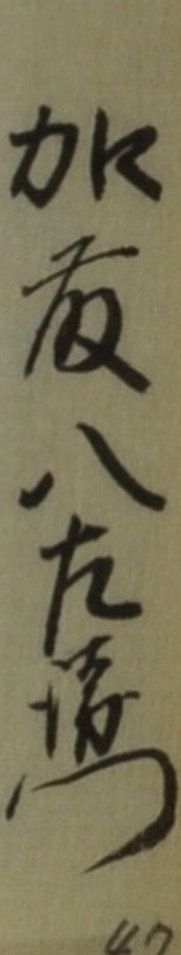加藤八左衛門
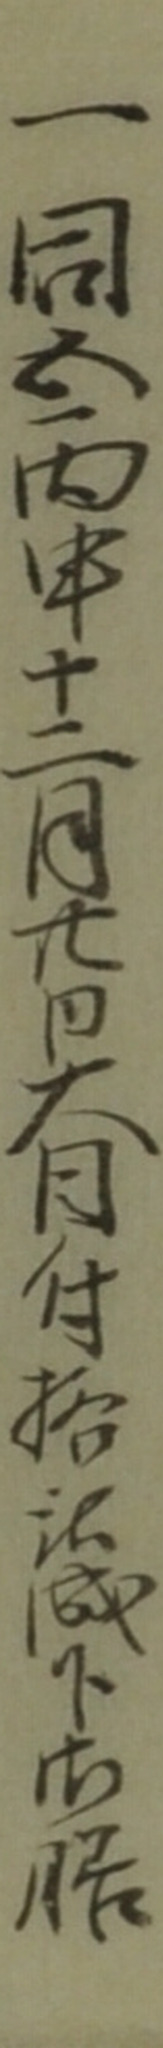一同五丙申十二月廿日大目付格被成下御膳
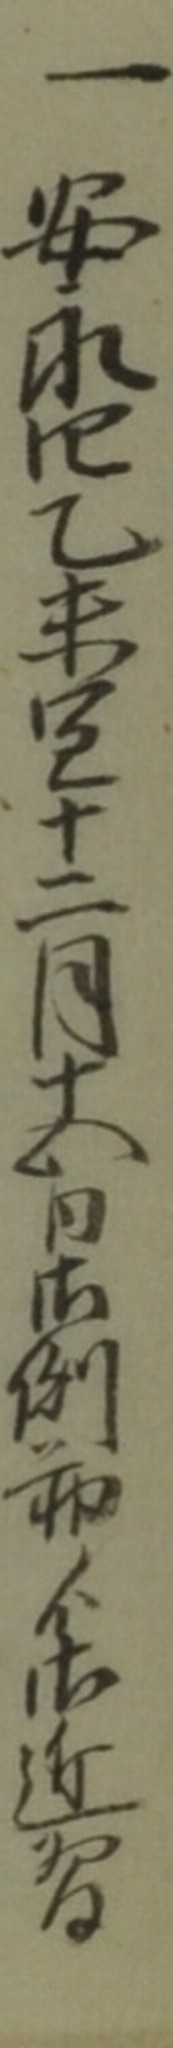一安永四乙巳閏十二月十五日御側勤ゟ御近習
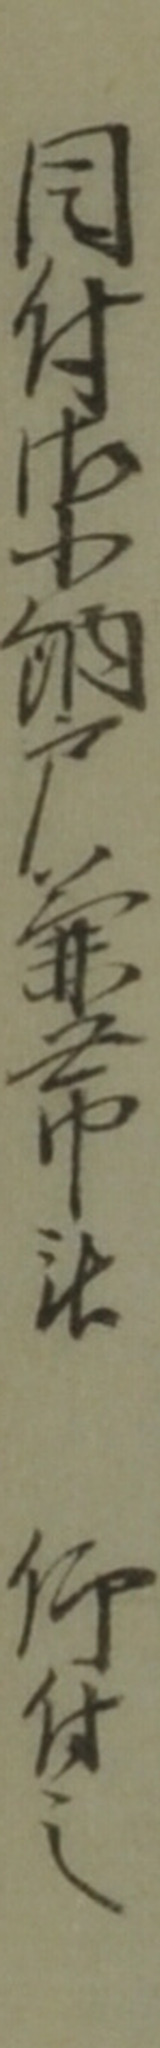目付御小納戸兼帯被仰付之
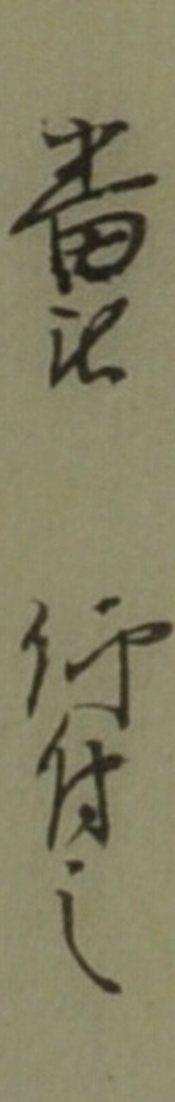番被仰付之
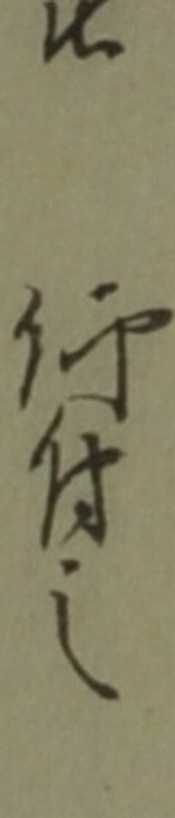仰付之
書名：諸御役代々録（四）
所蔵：伊那市立高遠町図書館・合同会社AMANE
